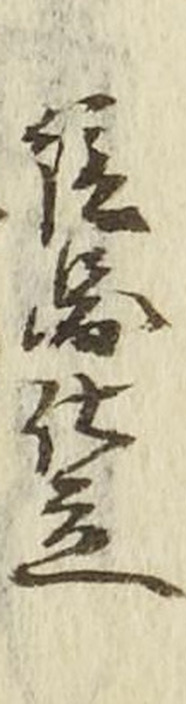絵図仕立

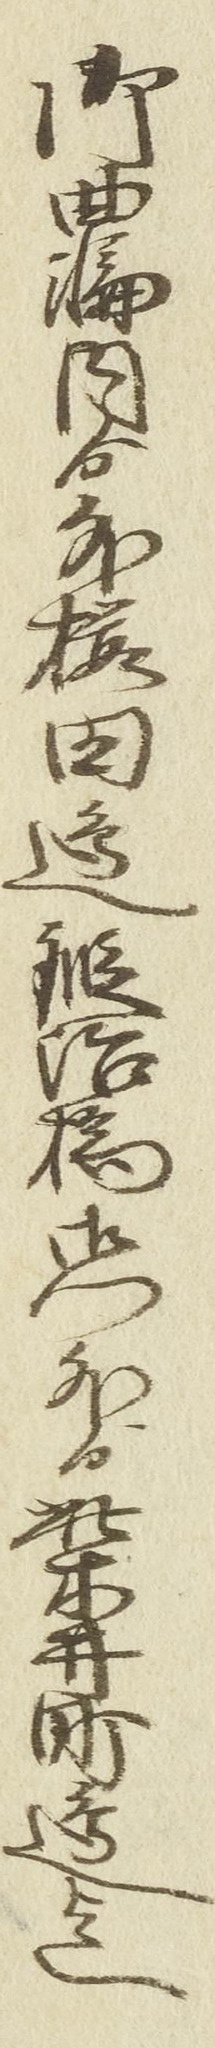御曲輪内ゟ外桜田迄鍛冶橋御門外ゟ柴井町辺迄
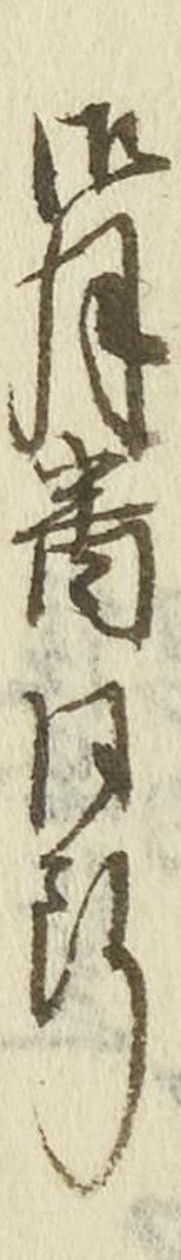御月番同断
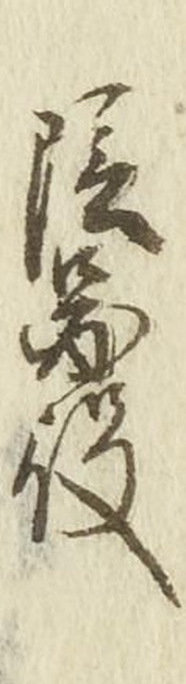絵図役
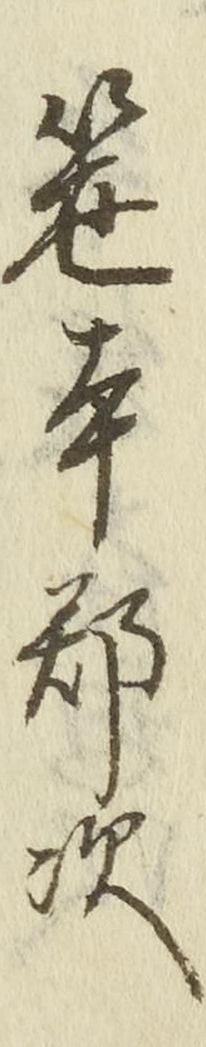笹本郡次
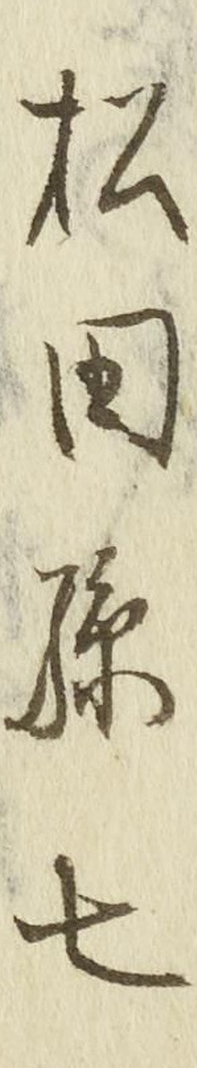松田孫七
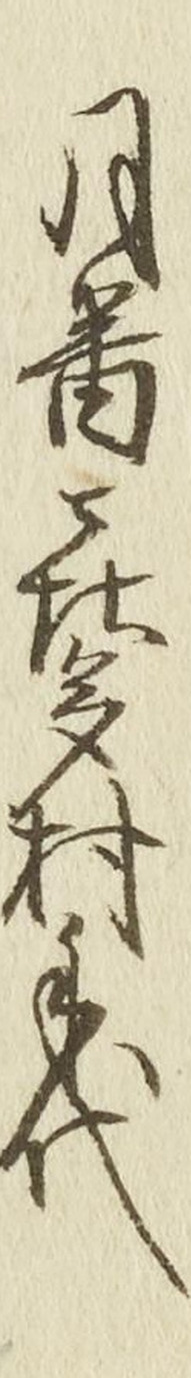月番喜多村手代
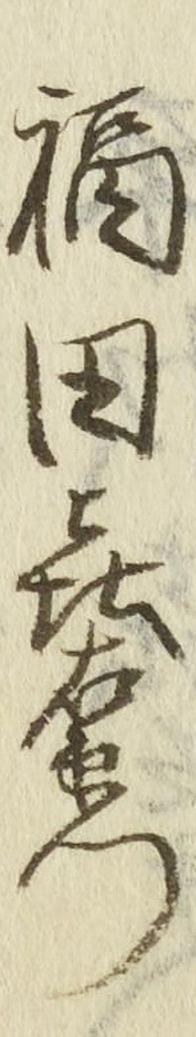福田喜右衛門
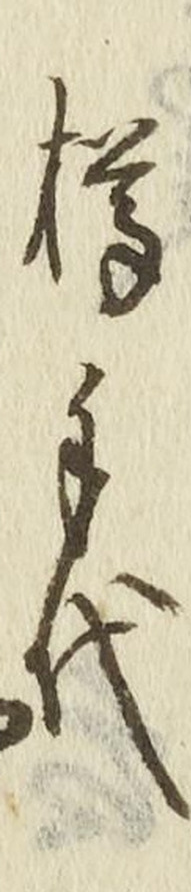樽手代
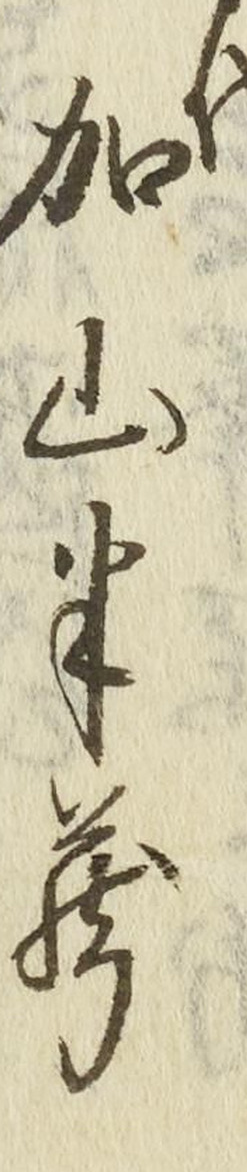加山米蔵
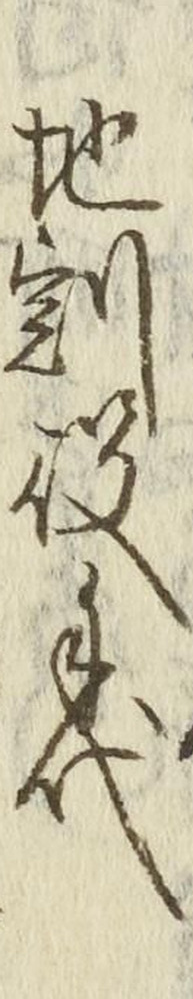地割役手代
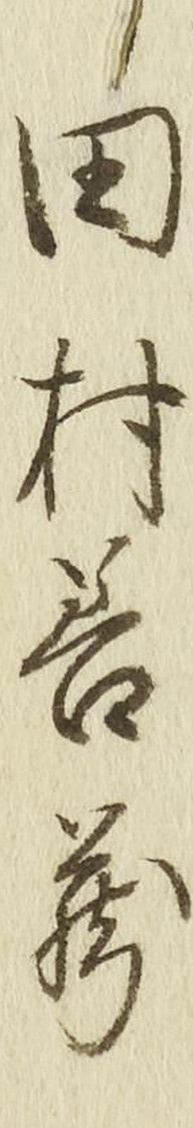田村善蔵
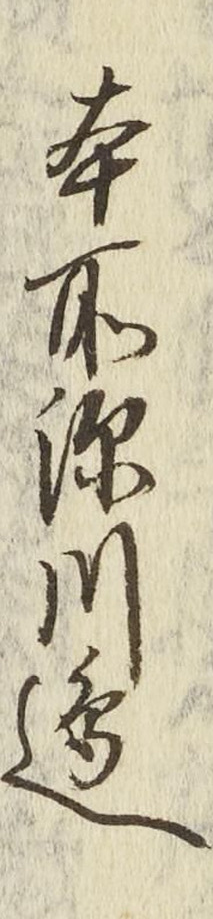本所深川辺
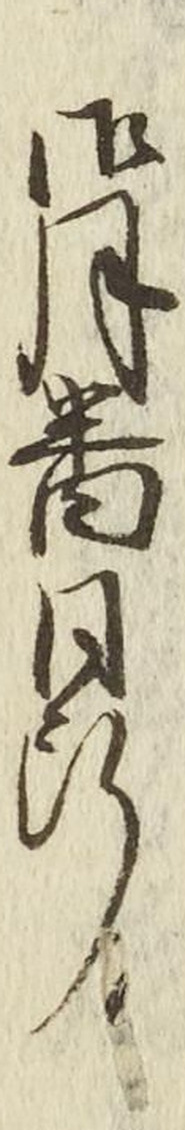御月番同断
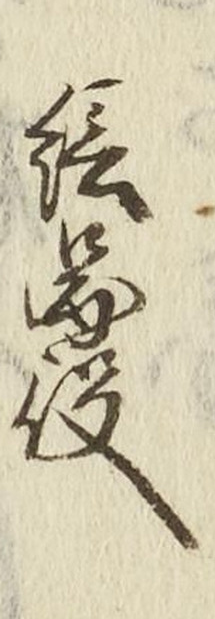絵図役
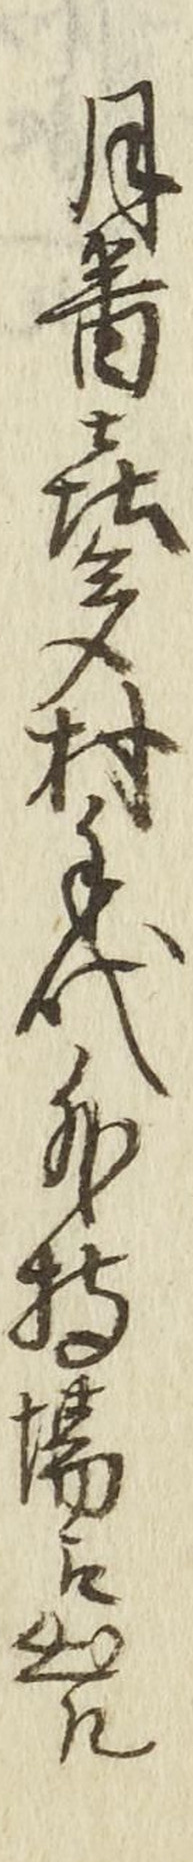月番喜多村手代外持場江出ル
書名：安政二年震災記事　完
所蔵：東京大学地震研究所図書室 Earthquake Research Institute Library, The University of Tokyo, JAPAN
